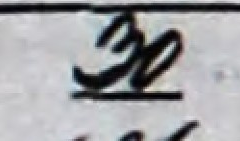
30
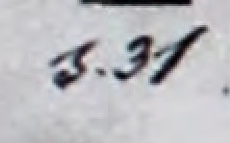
s. 31.
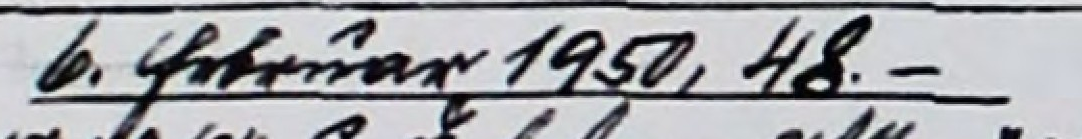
6. Februar 1950, 48. -
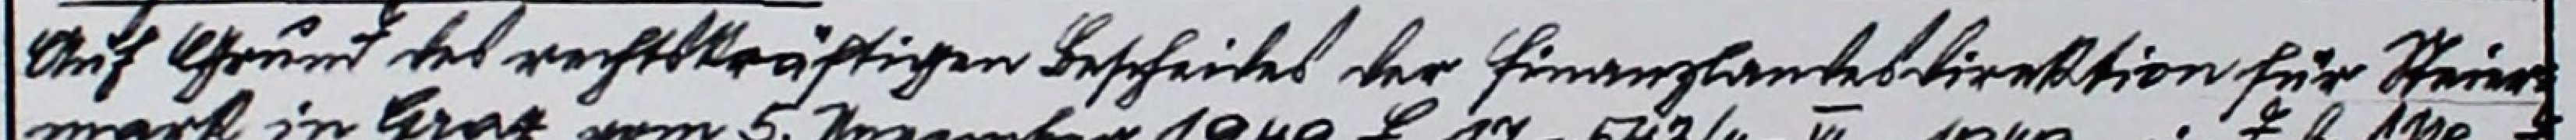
Auf Grund des rechtskräftigen Bescheides der Finanzlandesdirektion für Steier„
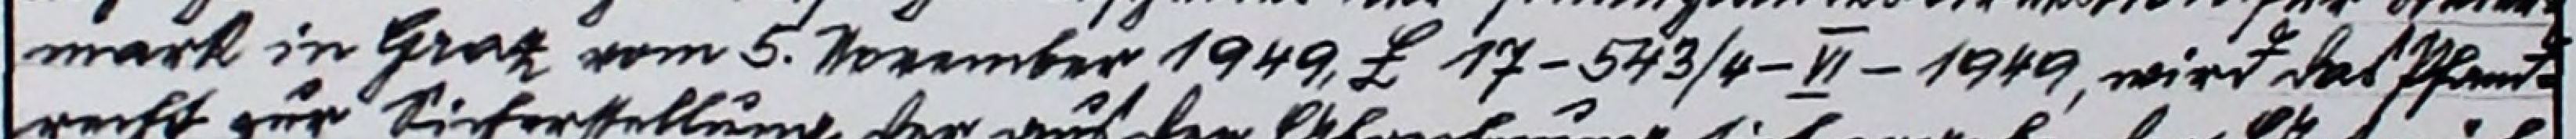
mark in Graz vom 5. November 1949, L 17 - 543/4 - VI - 1949. wird das Pfand„
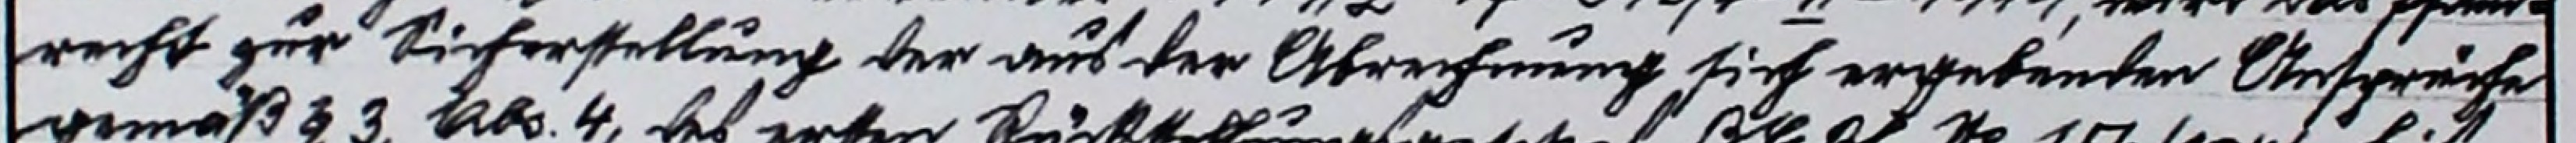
recht zur Sicherstellung der aus der Abrechnung sich ergebenden Anspräche
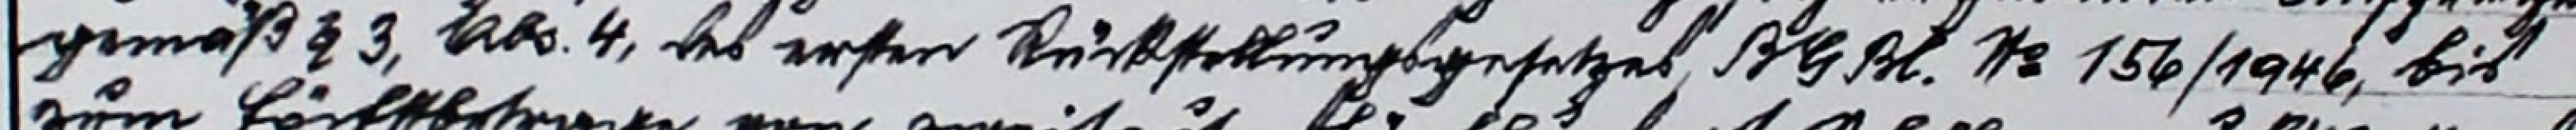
gemäß ? 3, Abs. 4, des ersten Rückstellungsgesetzes, B G Bl. No 156/1946, bis
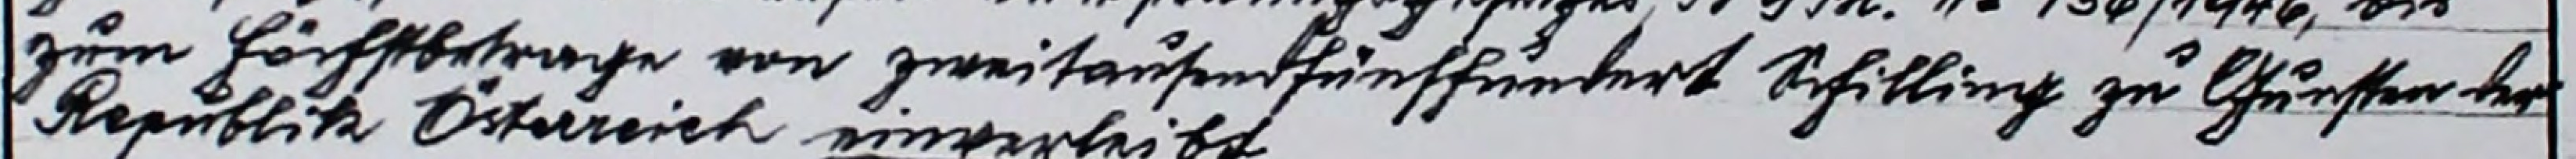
zum Höchstbetrage von zweitausendfünfhundert Schilling zu Gunsten der
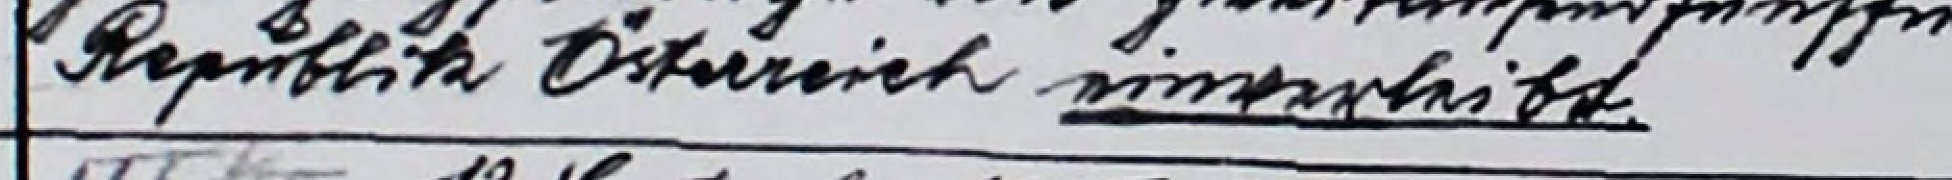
Republik Österreich einverleibt.
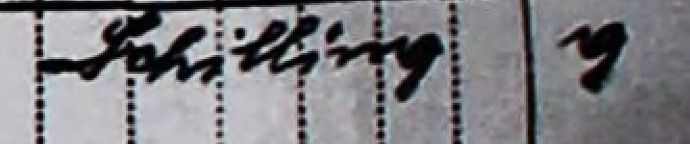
Schilling g
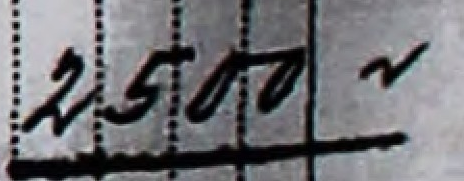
25002
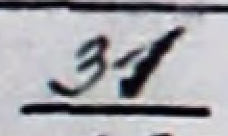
31
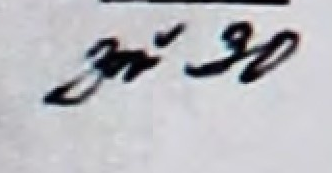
zu 30
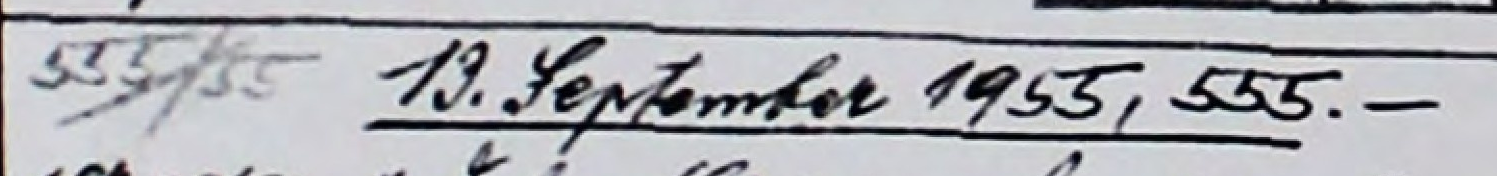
555/55 13. September 1955, 555.-
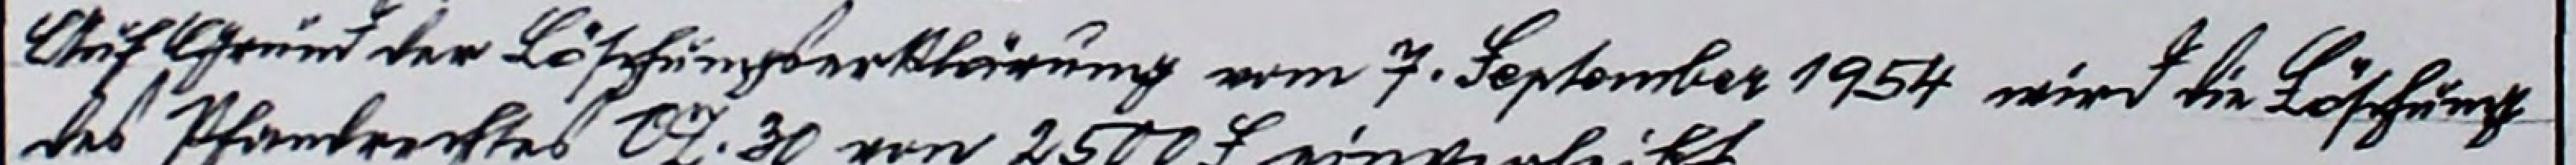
Auf Grund der Löschungserklärung vom 7. September 1954 wird die Löschung
